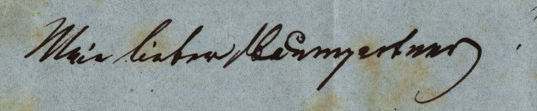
Mein lieber Baumgartner!
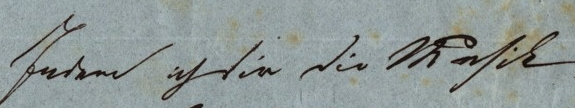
Indem ich dir die Musik,
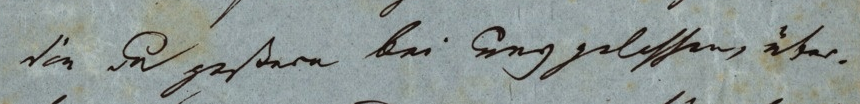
die Du gestern bei uns gelassen, über-
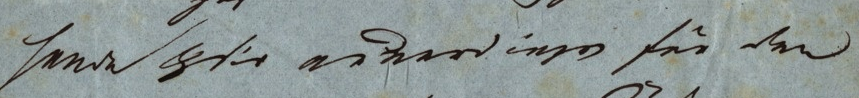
sende & dir neuerdings für den
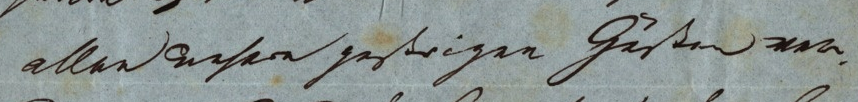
allen unsern gestrigen Gästen ver-
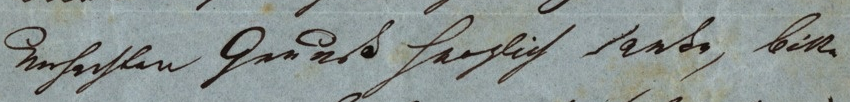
ursachten Genuß herzlich danke, bitte
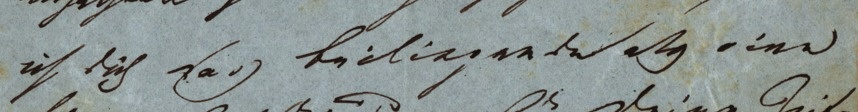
ich dich das beiliegende als eine
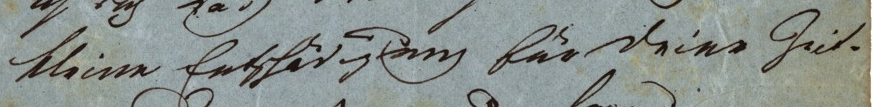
kleine Entschädigung für Deine Zeit-
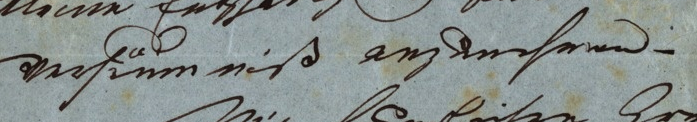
versäumniß anzunehmen –
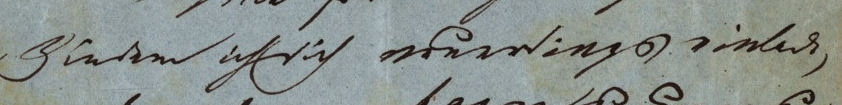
& indem ich dich neuerdings einlade,
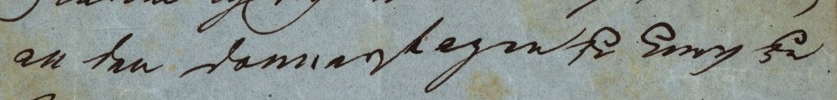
an den Donnerstagen zu uns zu
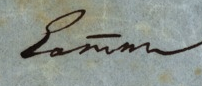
kommen
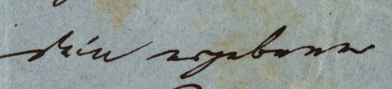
Dein ergebene
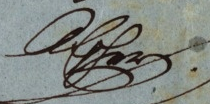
Belvoir
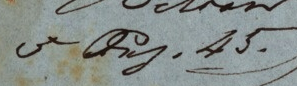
5 Aug. 45.
